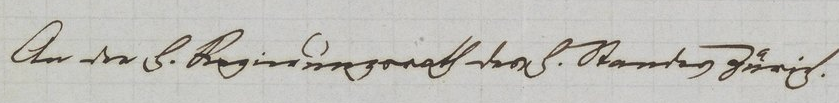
An den h. Regierungsrath des h. Standes Zürich.
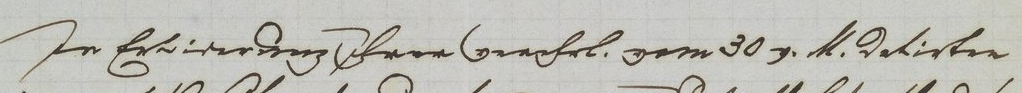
In Erwiderung Ihrer verehrl. vom 30 v. M. datirten
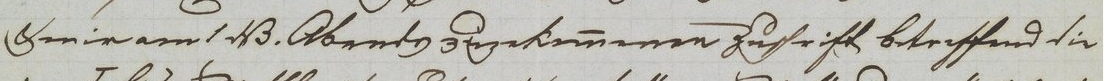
& mir am 1 dß. Abends zugekommenen Zuschrift betreffend die
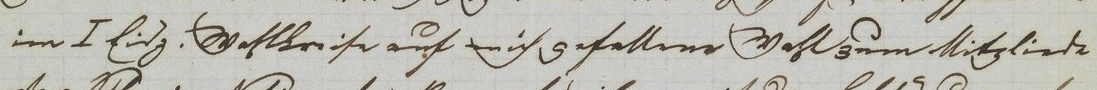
im I Eidg. Wahlkreise auf mich gefallene Wahl zum Mitgliede
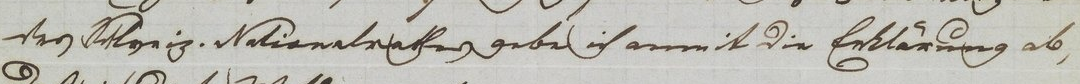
des Schweiz. Nationalrathes gebe ich anmit die Erklärung ab,
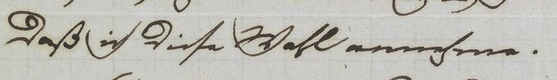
daß ich diese Wahl annehme.
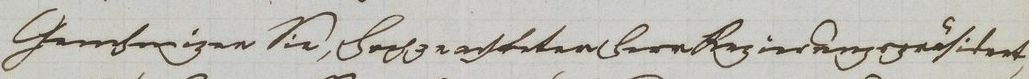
Genehmigen Sie, hochgeachteter Herr Regierungspräsident,
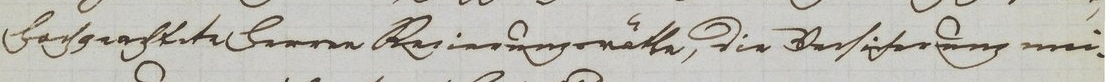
hochgeachtete Herren Regierungsräthe, die Versicherung mei-
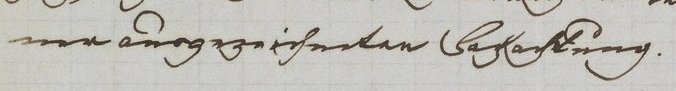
ner ausgezeichneten Hochachtung.
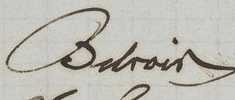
Belvoir,
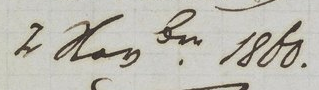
2 Novber 1860.
